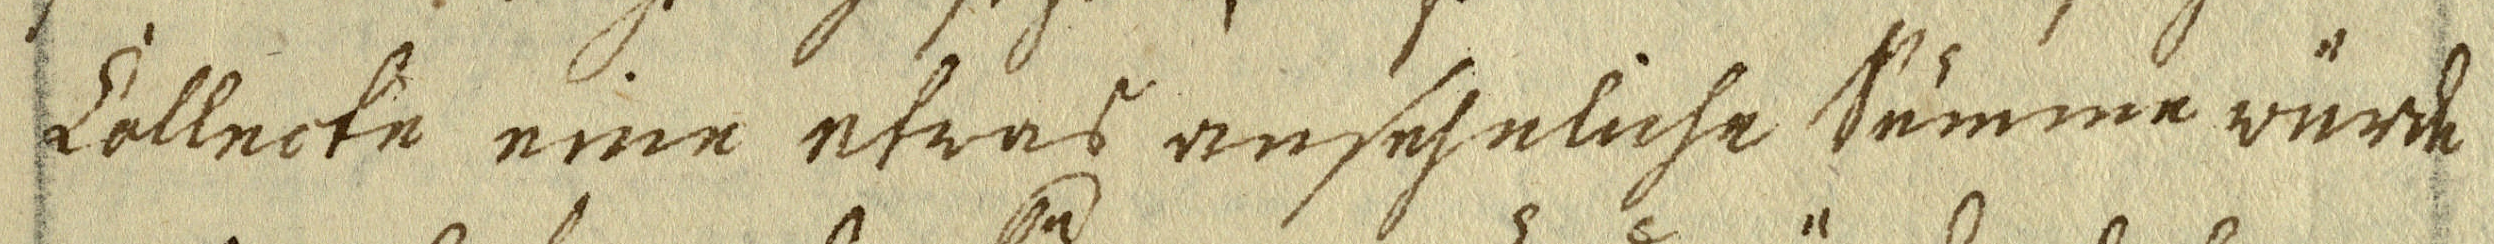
Collecte eine etwas ansehnliche Summe würde
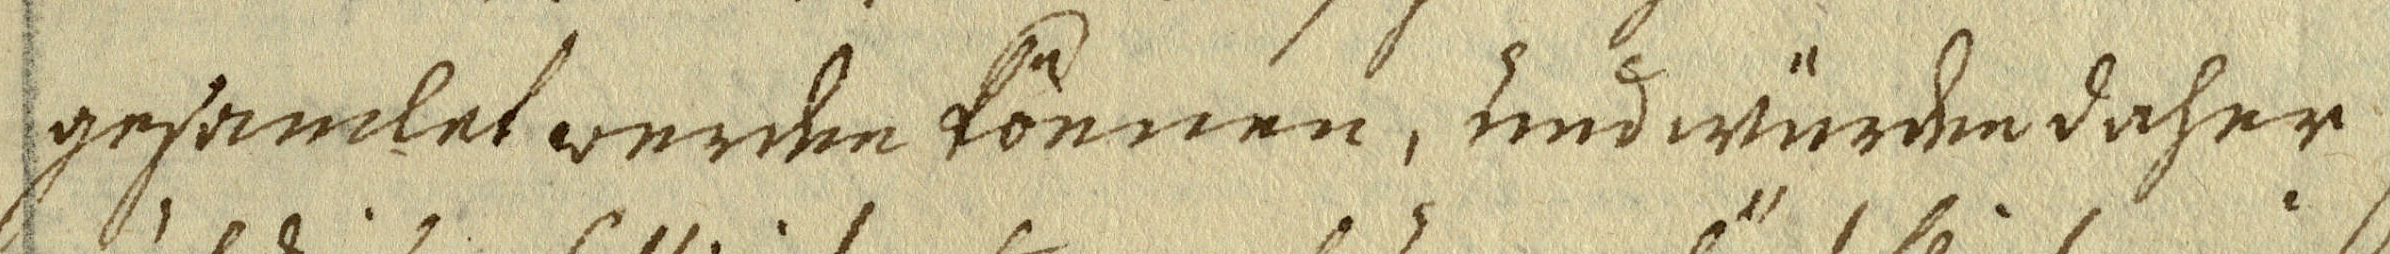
gesamlet werden können, und würden daher
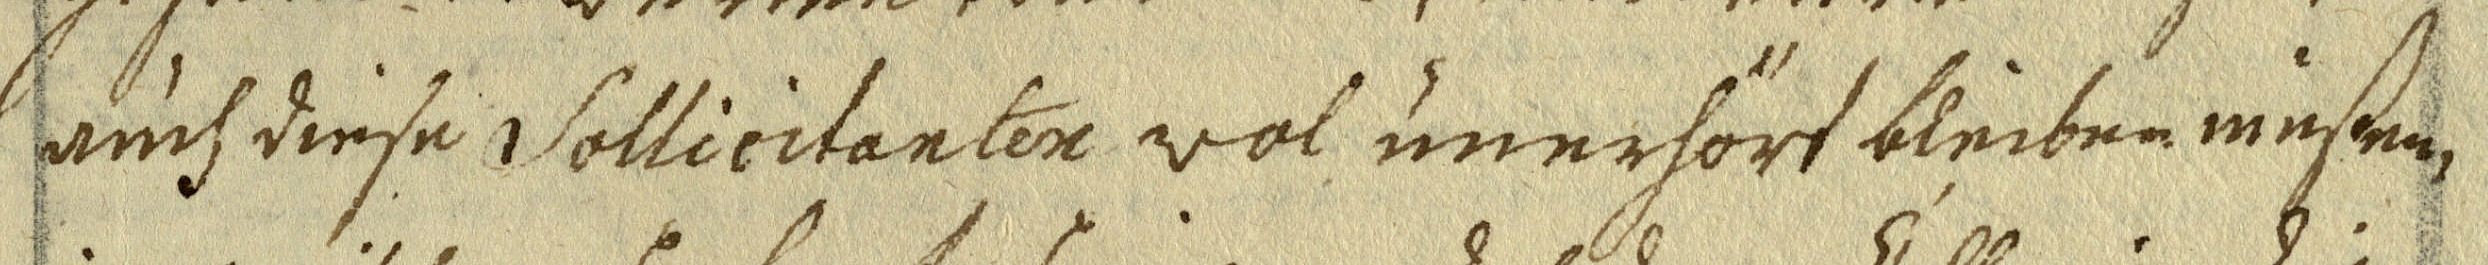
auch diese Sollicitanten wol unerhört bleiben müßen,
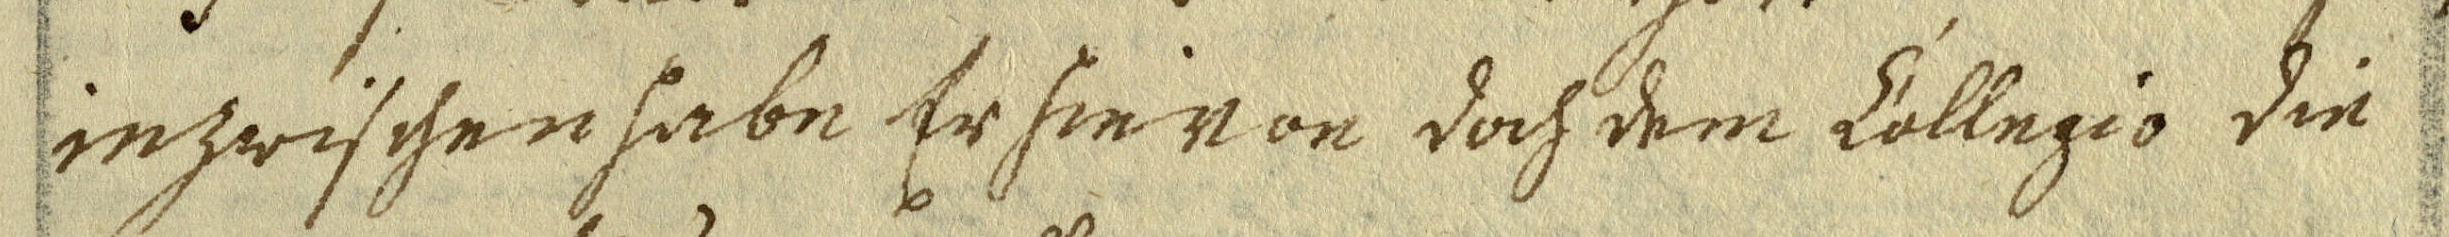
inzwischen habe Er hievon doch dem Collegio die
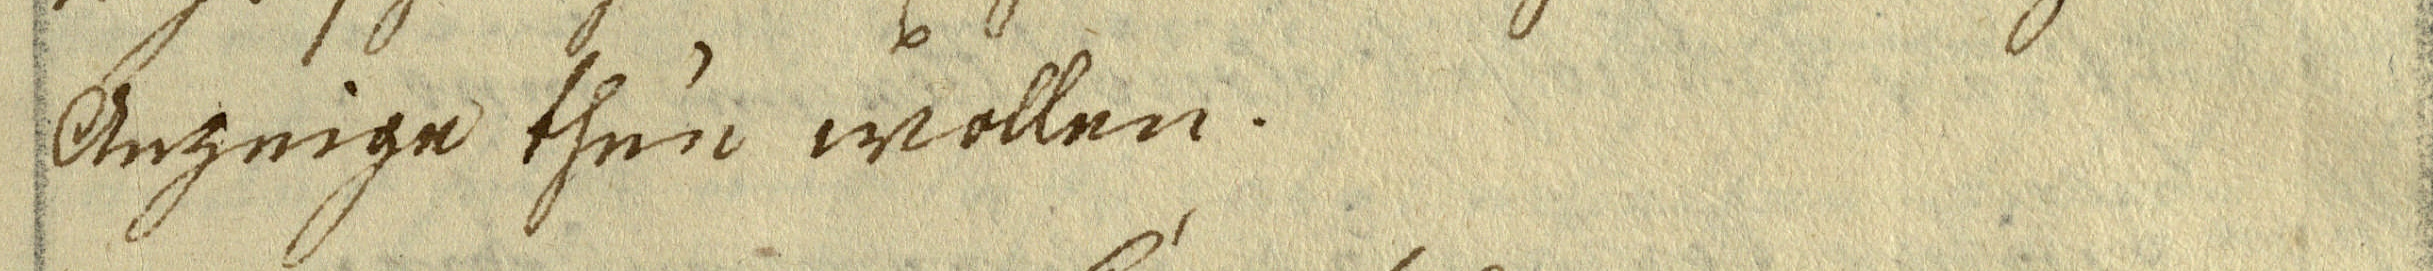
Anzeige thun wollen.
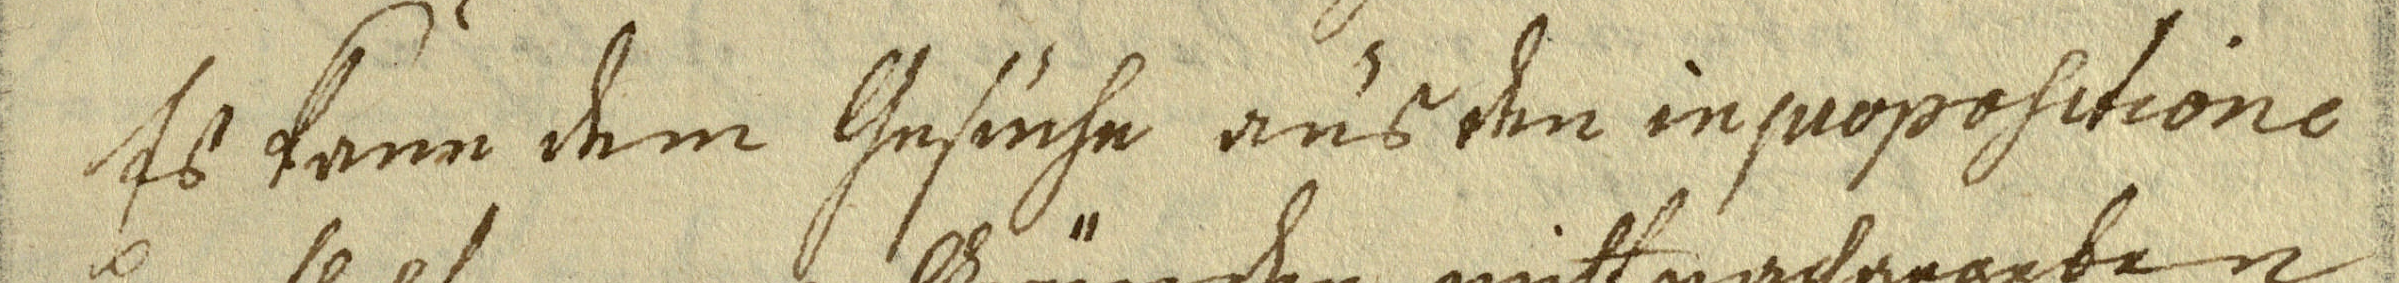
Es kann dem Gesuche aus den in propositione
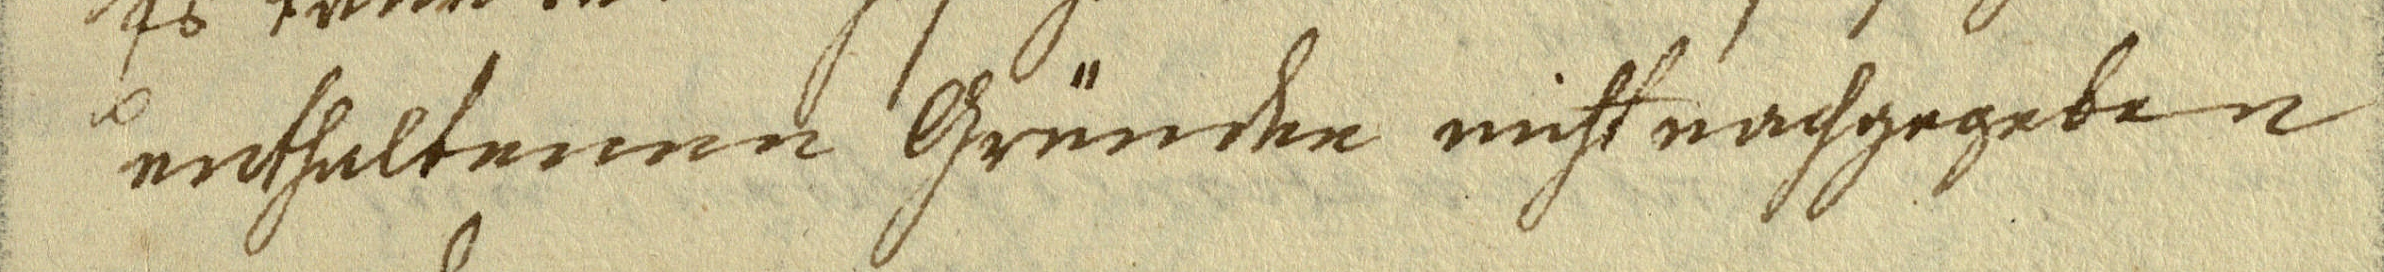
enthaltenen Gründen nicht nachgegeben
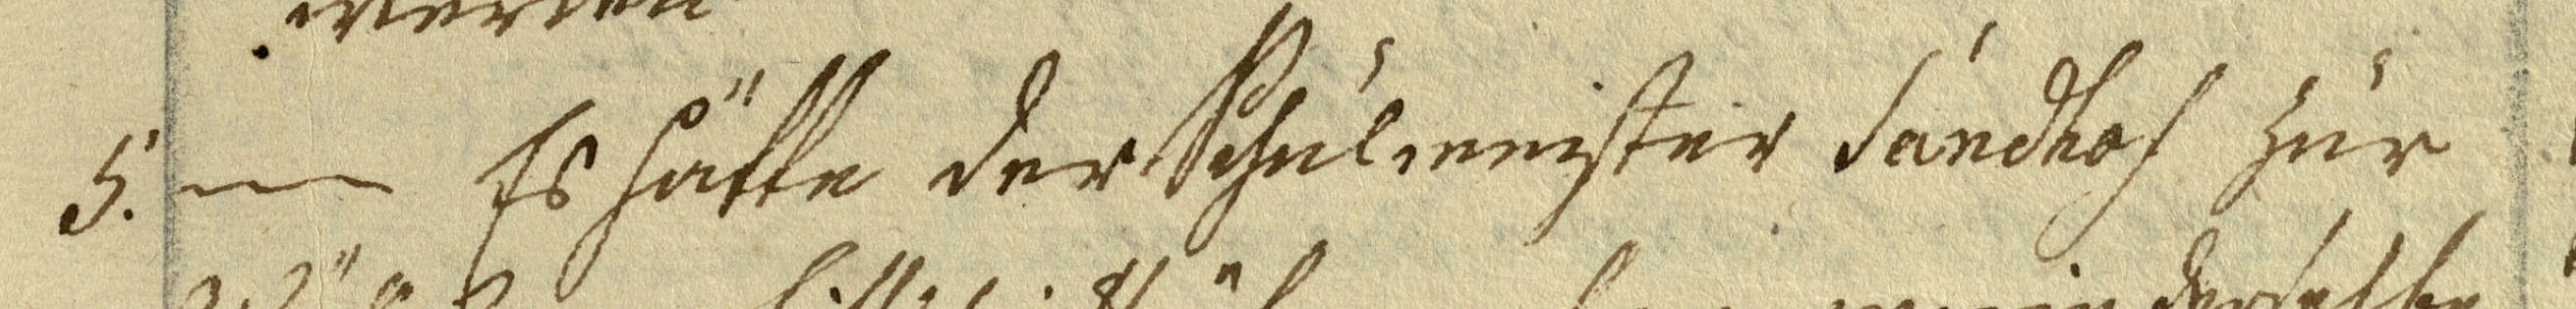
5. Es hätte der Schulmeister Sandhof zur
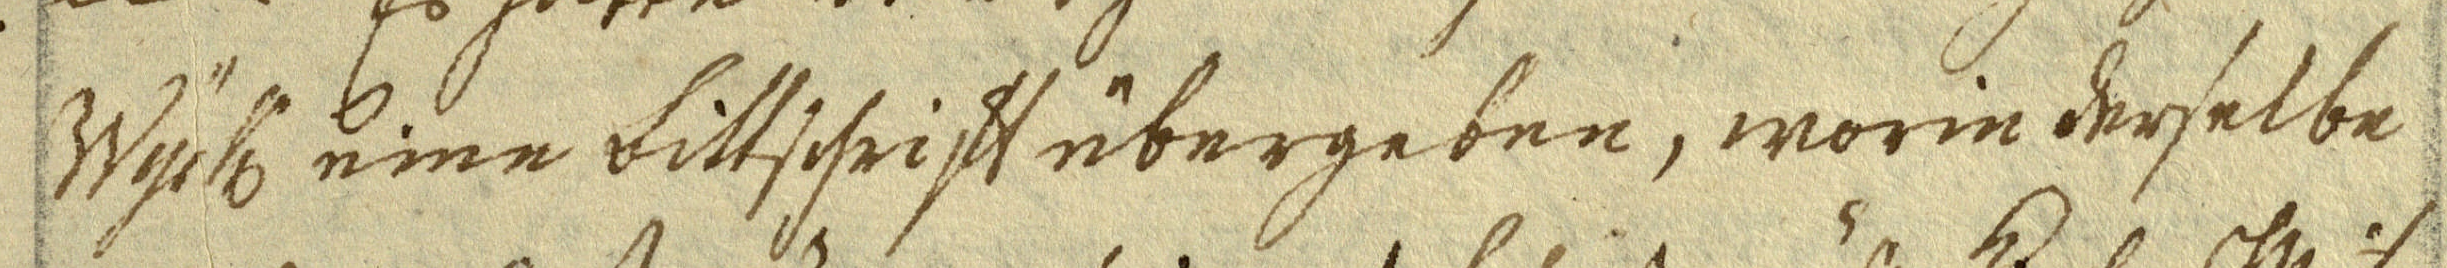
Wÿck eine Bittschrift übergeben, worin derselbe
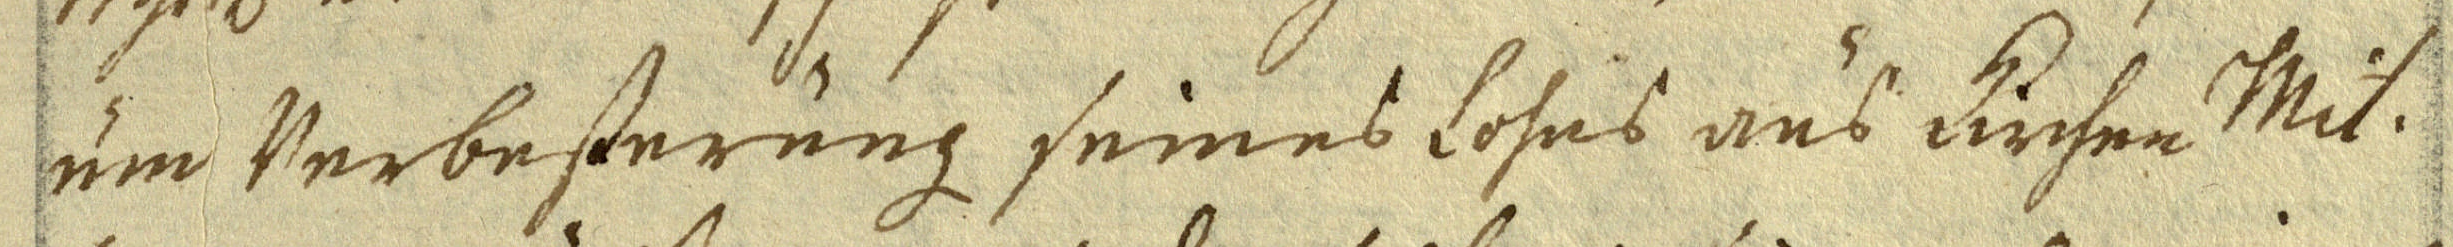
um Verbeßerung seines Lohns aus Kirchen Mit¬
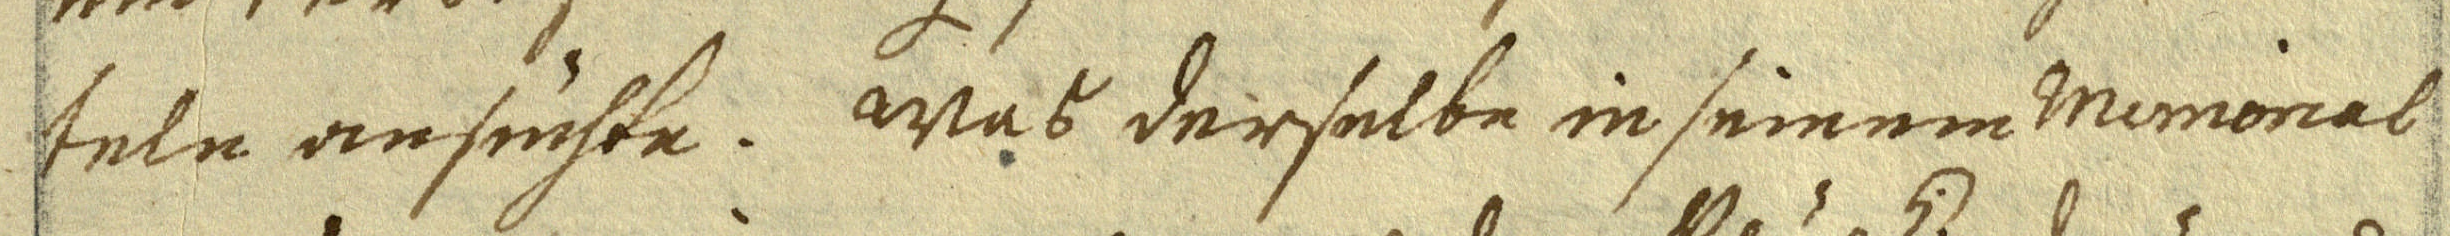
teln ansuchte. Was derselbe in seinem Memorial
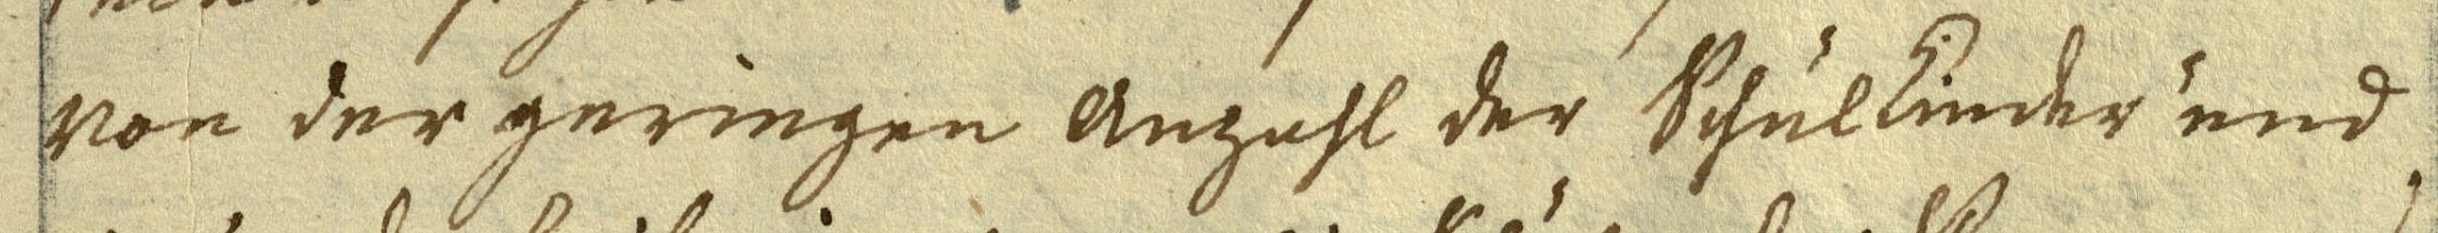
von der geringen Anzahl der Schulkinder und
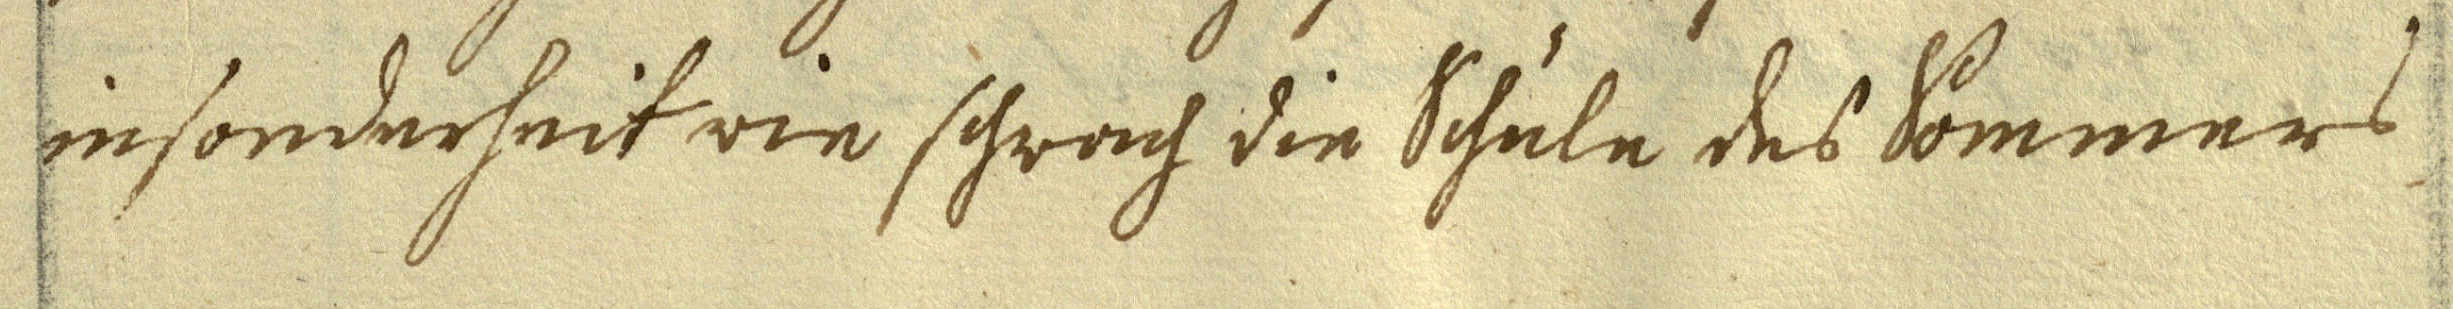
insonderheit wie schwach die Schule des Sommers
